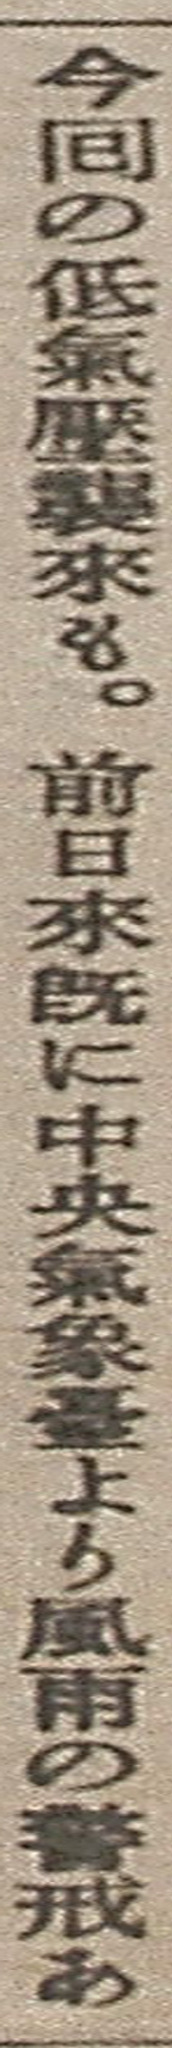今回の低気圧襲来も。前日来既に中央気象台より風雨の警戒あ
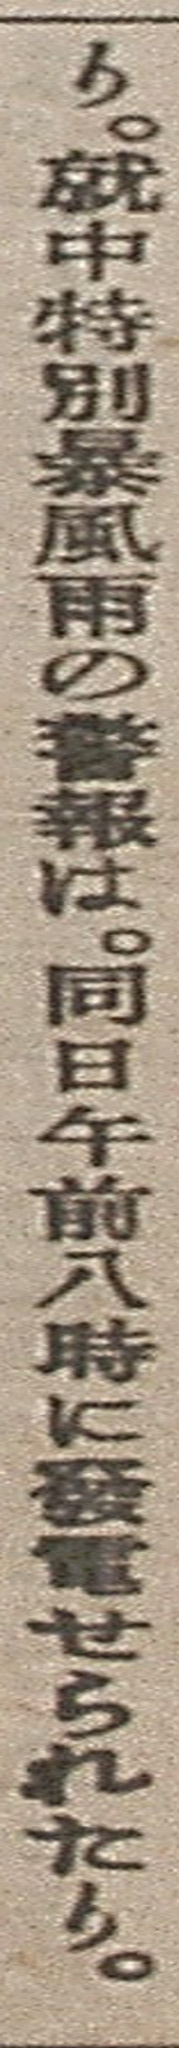り。就中特別暴風雨の警報は。同日午前八時に発電せられたり。
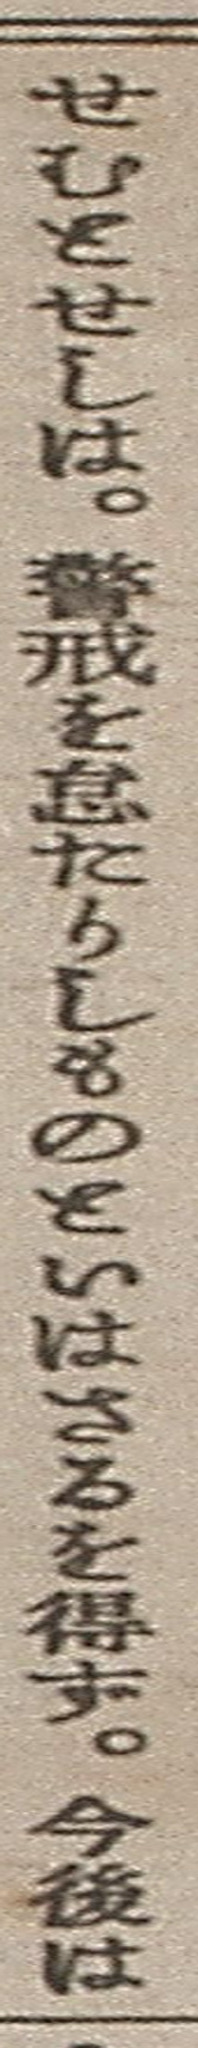せむとせしは。警戒を怠たりしものといはさるを得ず。今後は
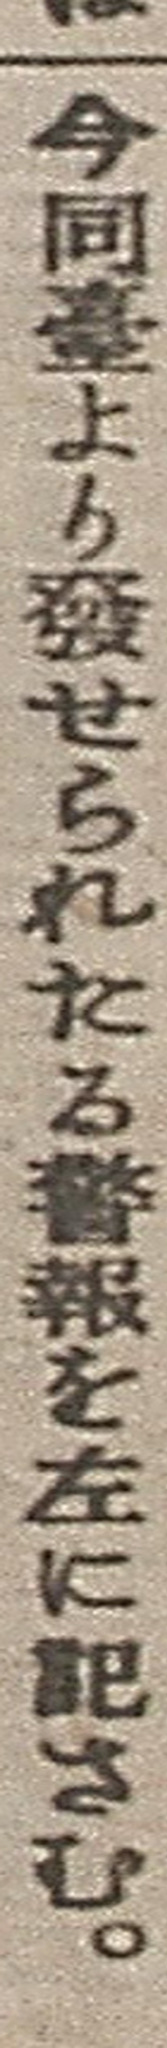今同台より発せられたる警報を左に記さむ。
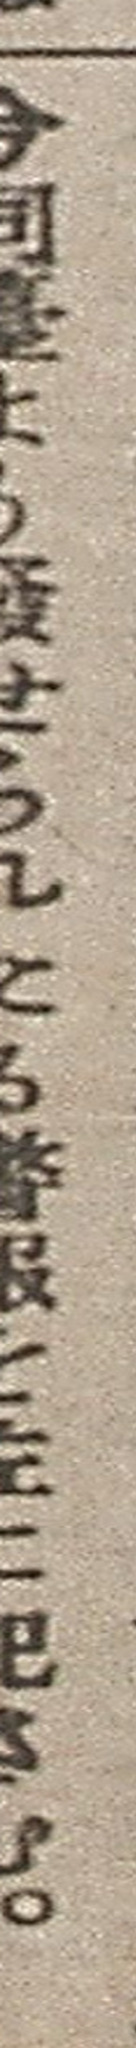今同台より発せられたる警報を左に記さむ。
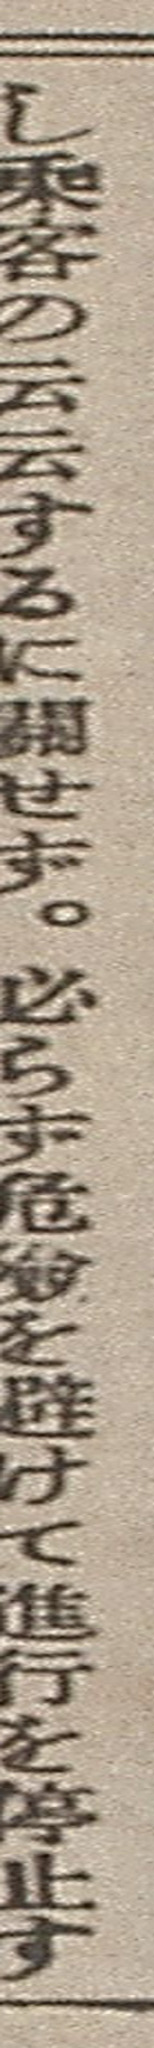し乗客の云云するに關せず。必らず危険を避けて進行を停止す
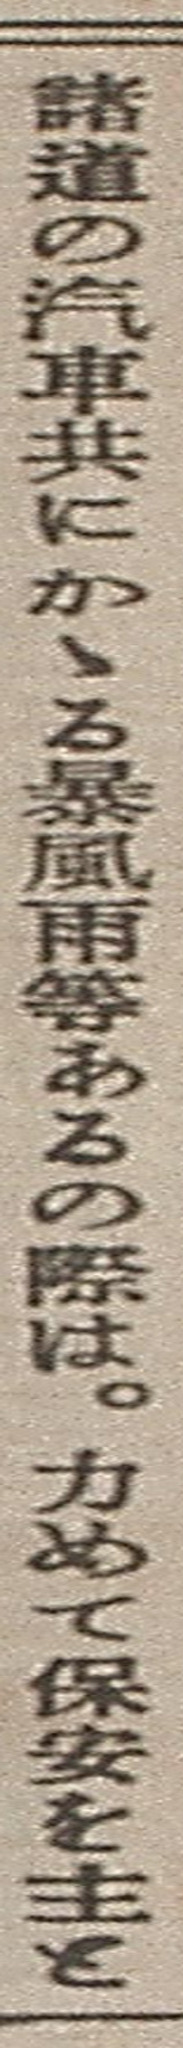諸道の汽車共にかゝる暴風雨等あるの際は。力めて保安を主と
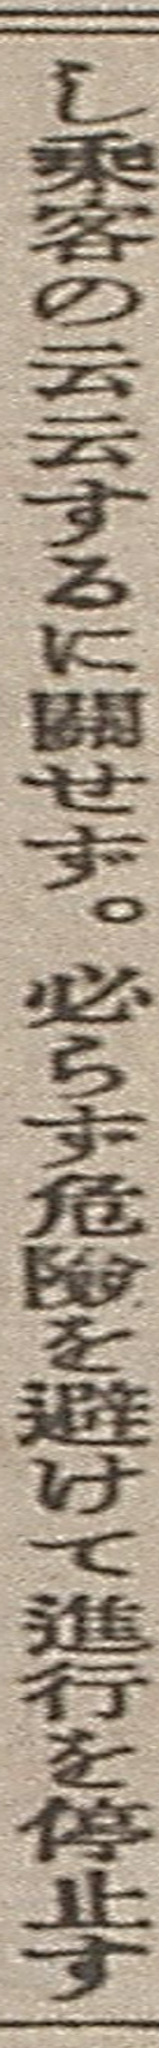し乗客の云云するに關せず。必らず危険を避けて進行を停止す
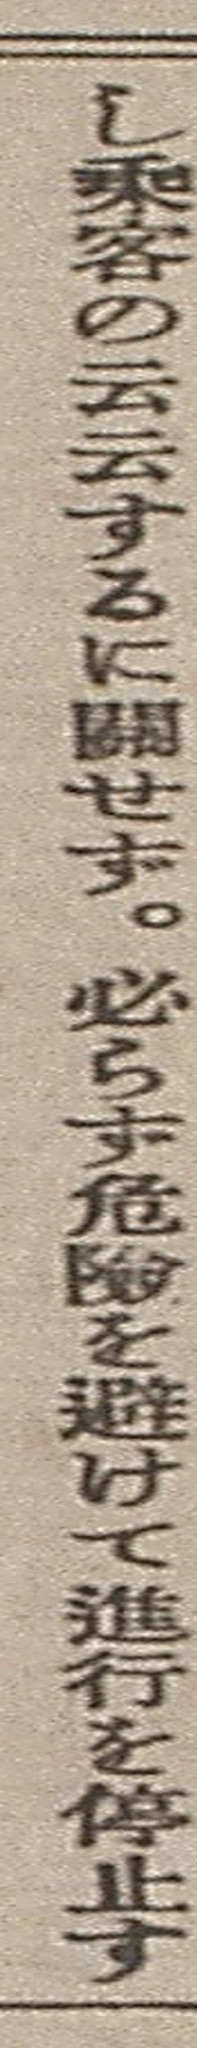し乗客の云云するに關せず。必らず危険を避けて進行を停止す
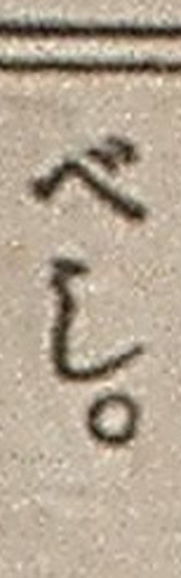べし。
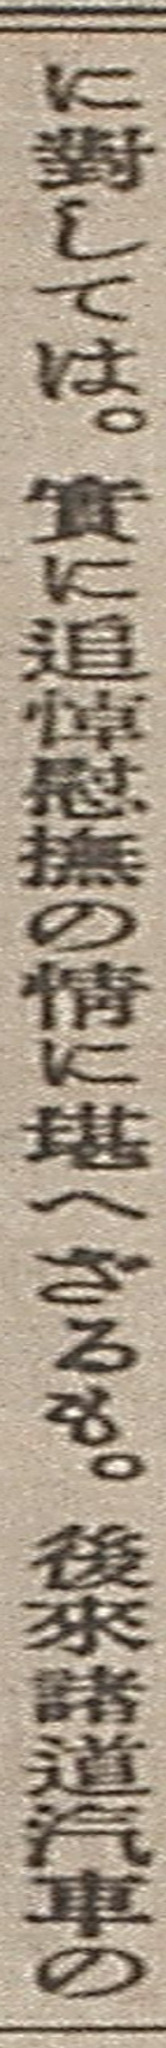に対しては。実に追悼慰撫の情に堪へざるも。後来諸道汽車の
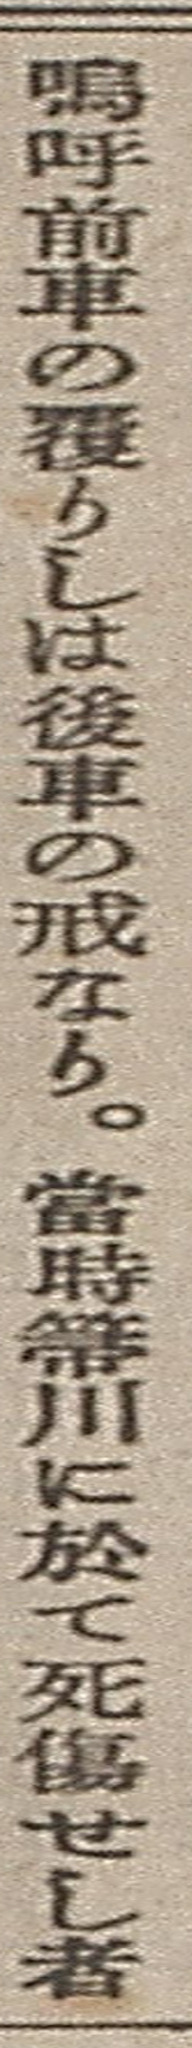嗚呼前車の覆りしは後車の戒なり。当時箒川に於て死傷せし者
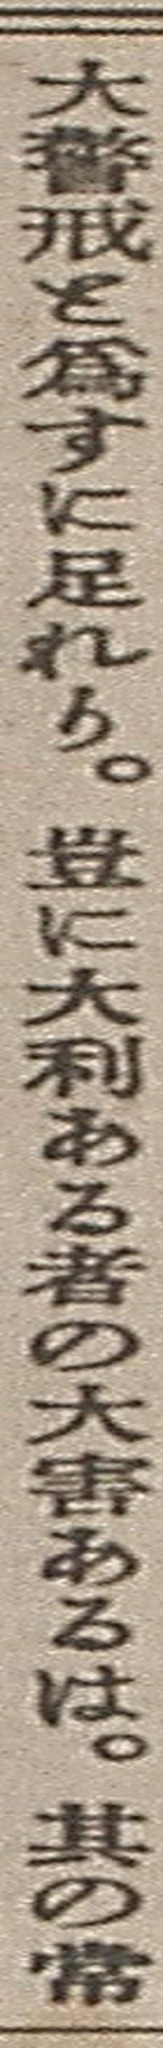台警戒と為すに足れり。豈に大利ある者の大害あるは。其の常
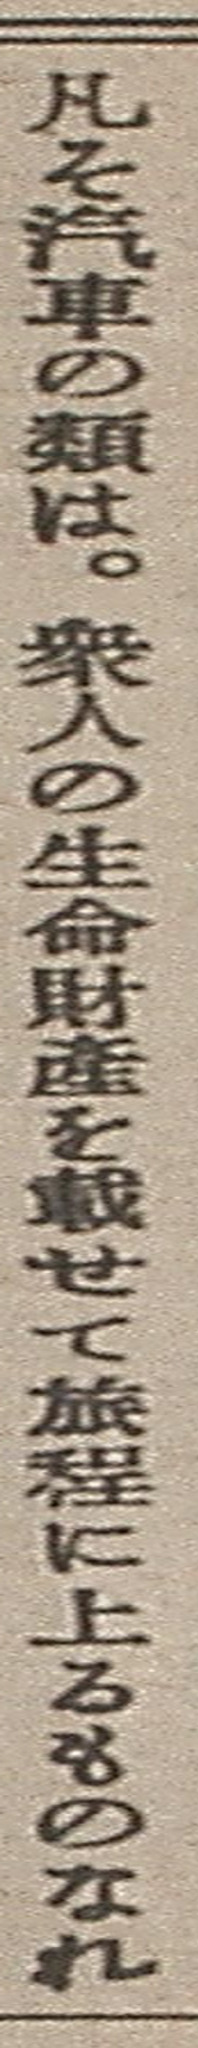凡そ汽車の類は。衆人の生命財産を載せて旅程に上るものなれ
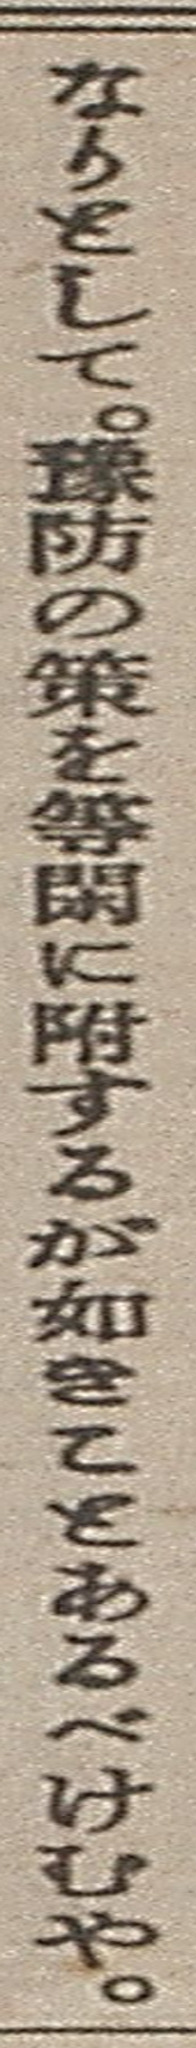なりとして。予防の策を等閑に附するが如きことあるべけむや。
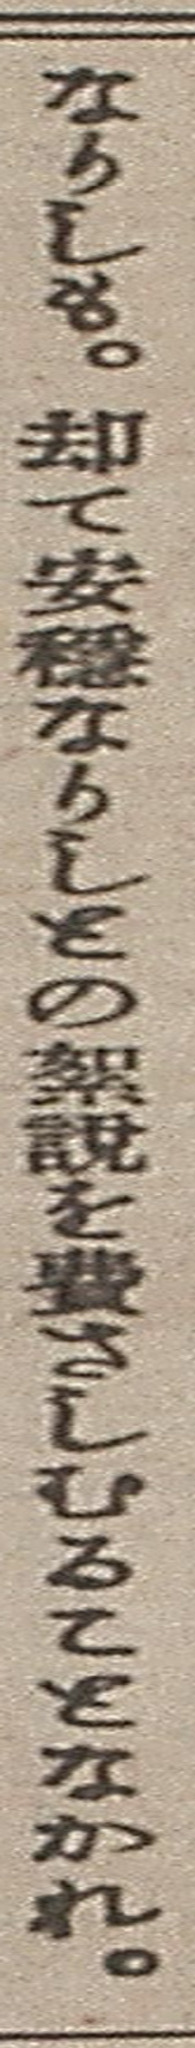なりしも。却て安穏なりしとの絮説を費さしむることなかれ。
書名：風俗畫報臨時増刊第百九十九號　明治三十二年十月各地災害圖會（前編之續）
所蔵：東京大学地震研究所図書室 Earthquake Research Institute Library, The University of Tokyo, JAPAN
